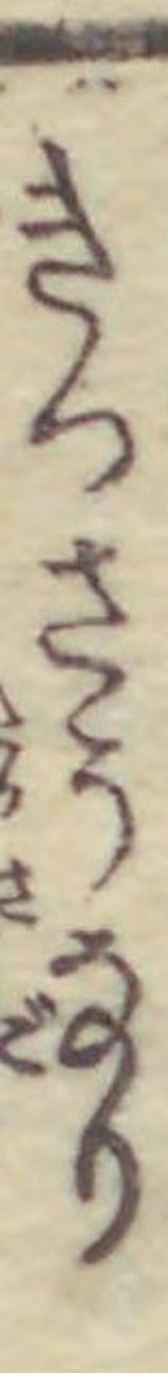きつさうなり
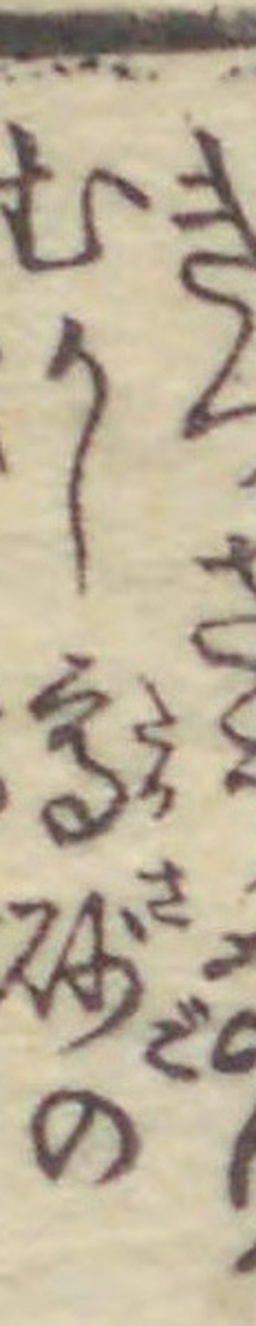むかし高砂の
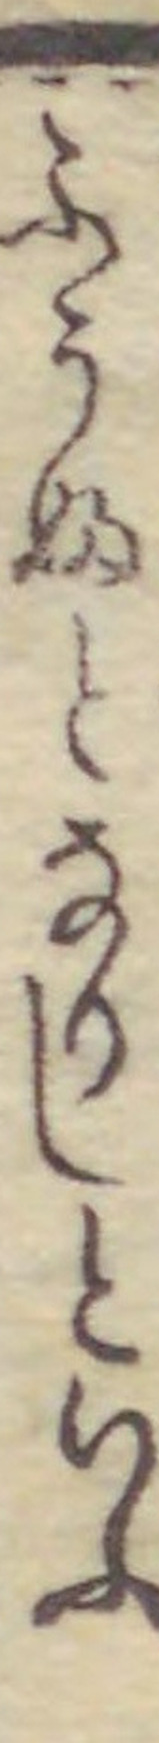ふうふとなりしといふ
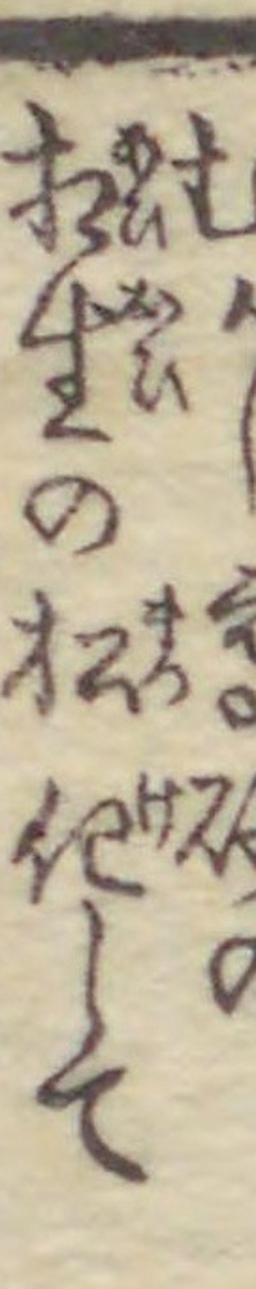相生の松化して
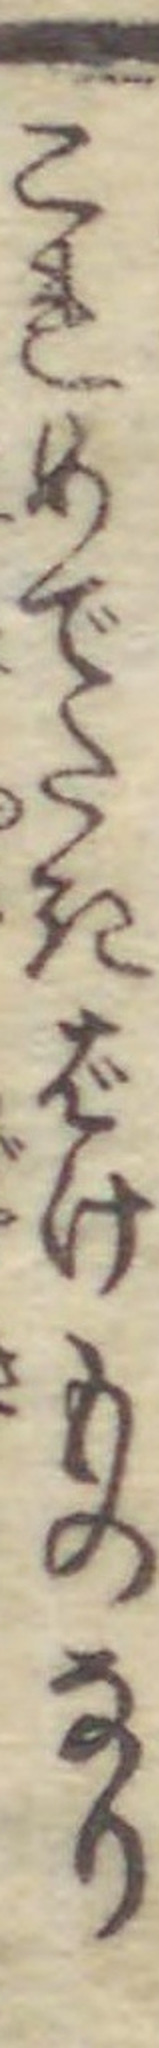これめでたきばけものなり
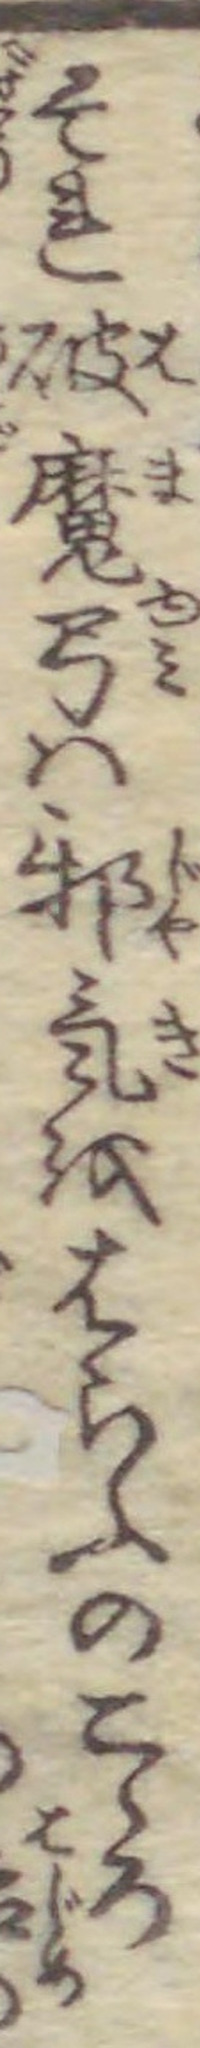それ破魔弓は邪気をはらふのこゝろ
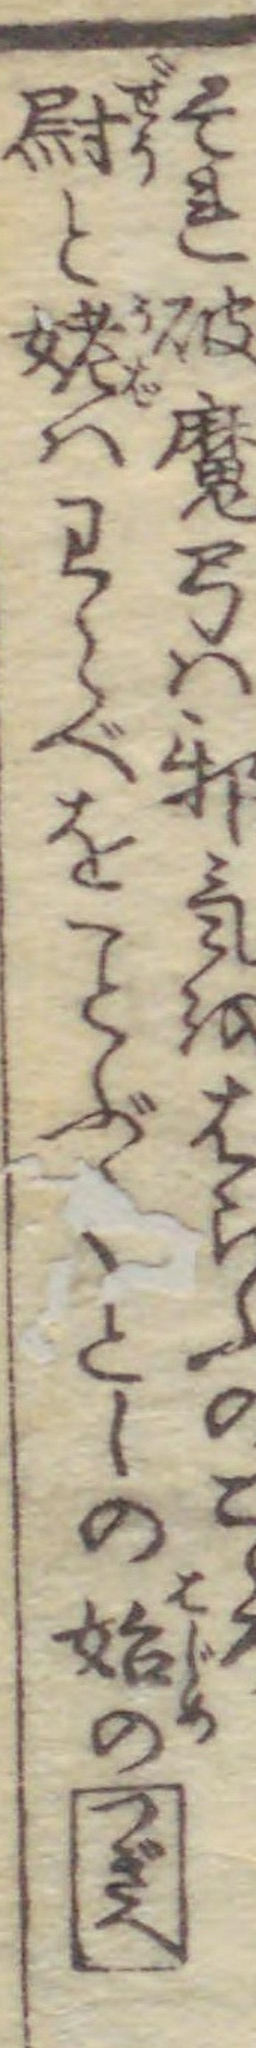尉と姥はわらべをことぶくとしの始のつぎへ

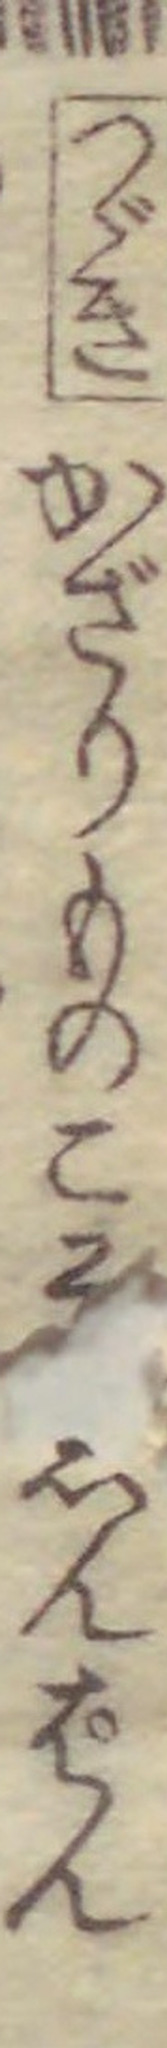つゞきかざりものこそしんぱん
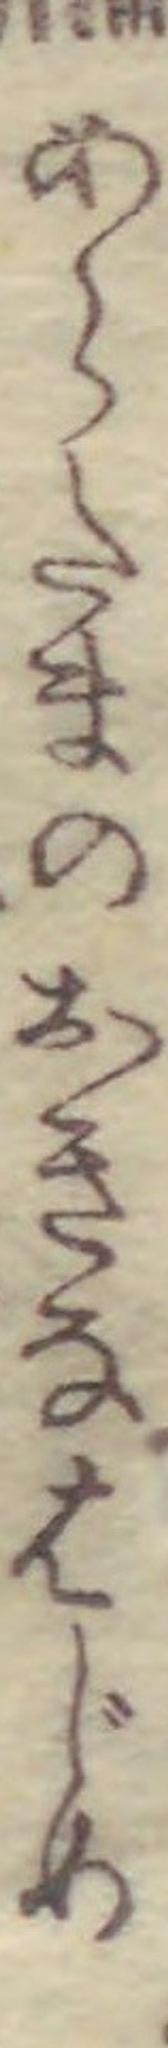あらたまのおきなはじめ
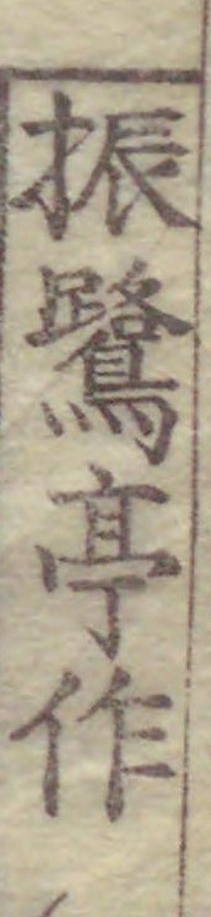振鷺亭作
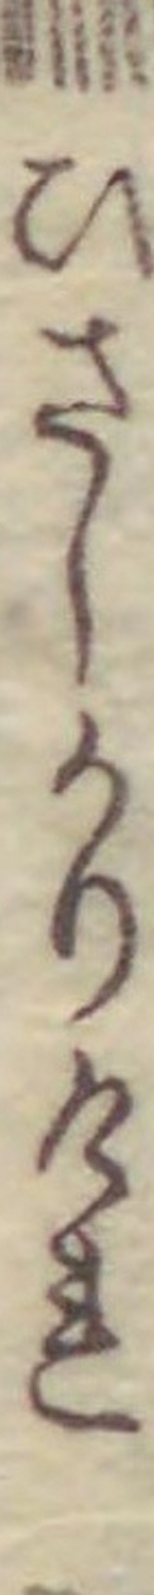ひさしかりけれ
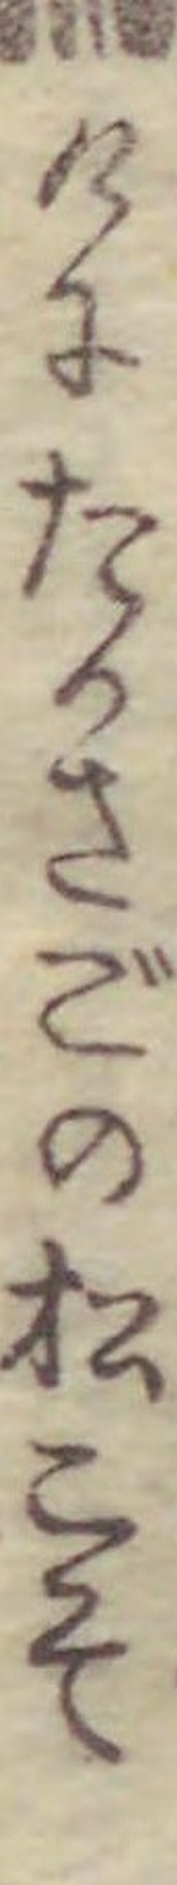けにたかさごの松こそ
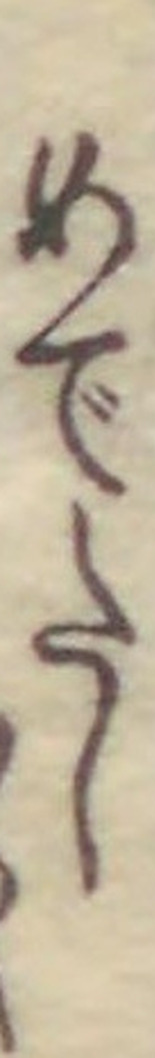めでたし
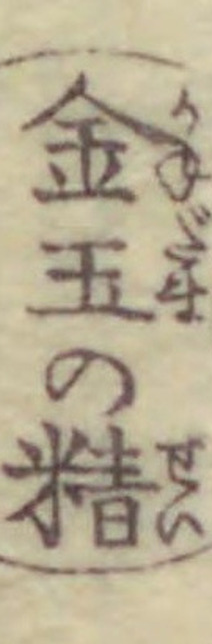金玉の精
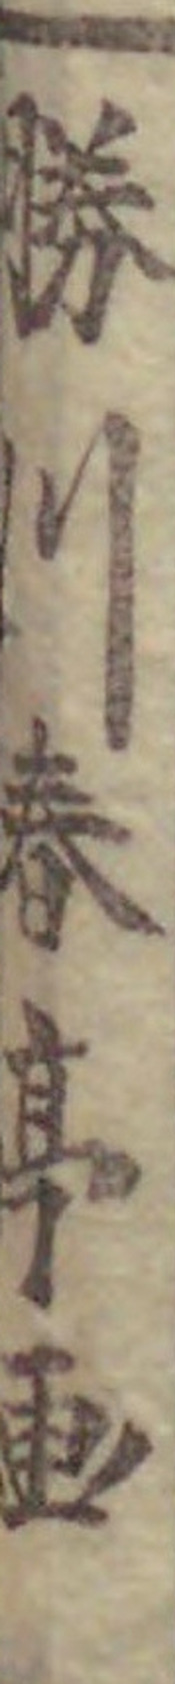勝川春亭画
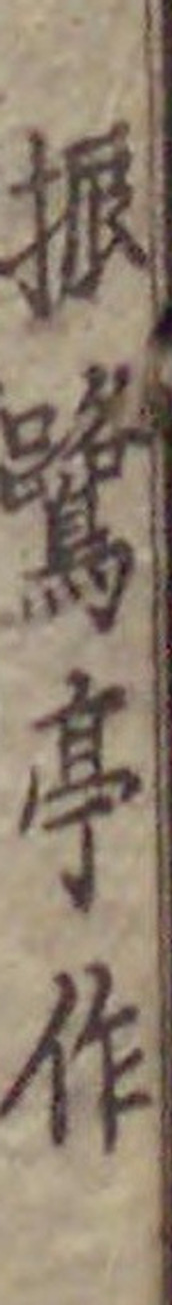振鷺亭作
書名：大時代唐土化物 3巻. 曽我太夫染
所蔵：国立国会図書館 National Diet Library, JAPAN
